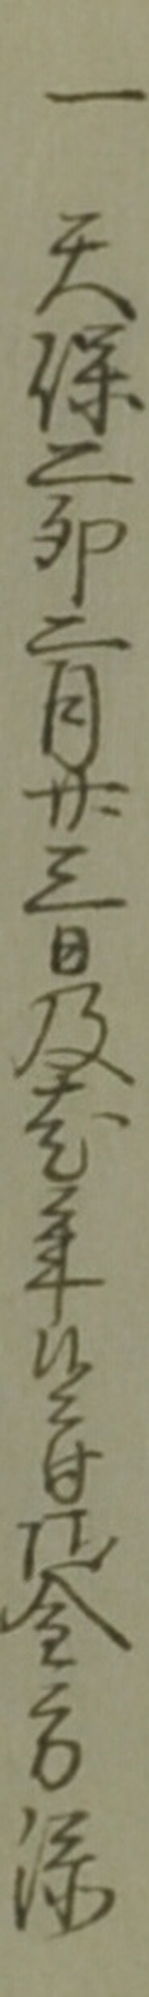一天保二卯二月廿三日及老年候付御金方添
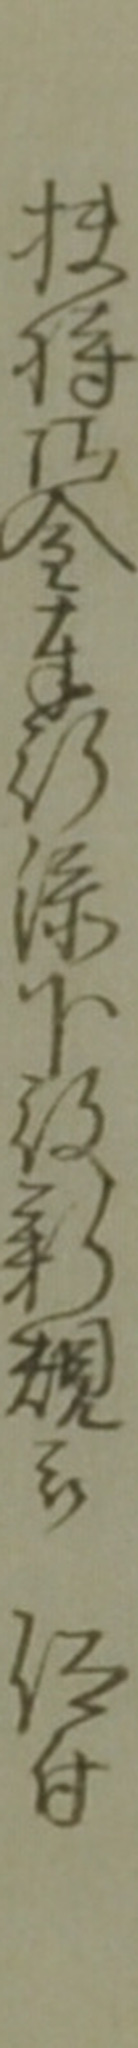扶持御金奉行添下役新規非被仰付
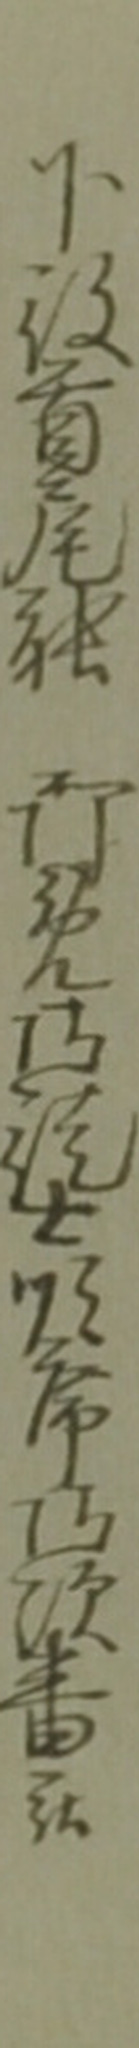下役首尾能御免御徒士順席御次番被
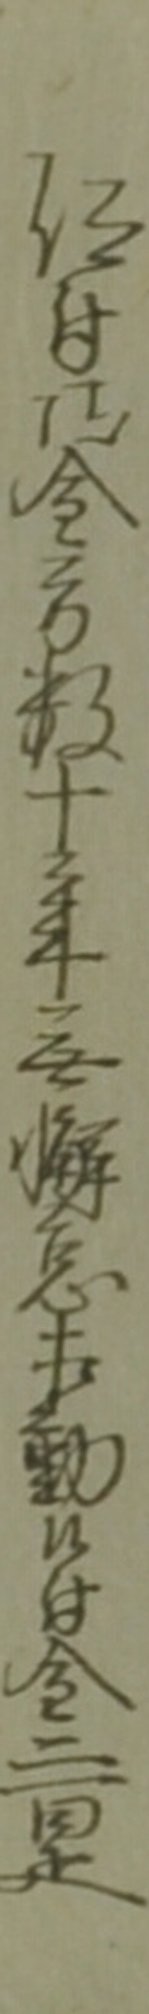仰付御金方数十年無懈怠相勤候付金二百疋

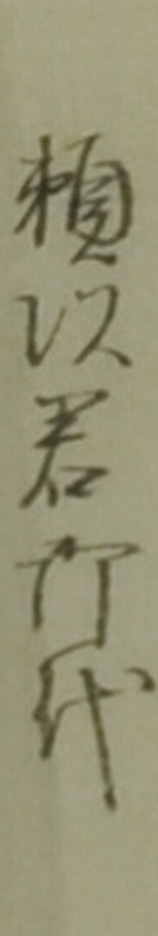頼以君御代
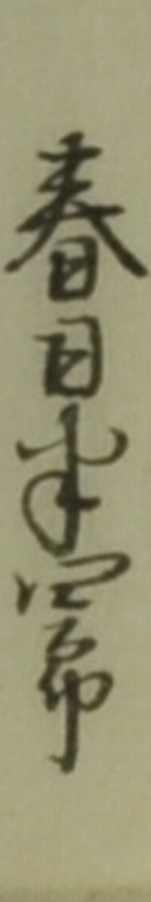春日半四郎
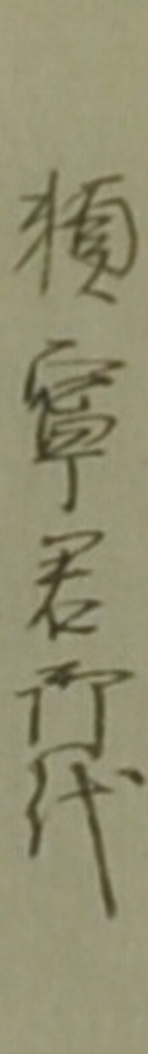頼寧君御代
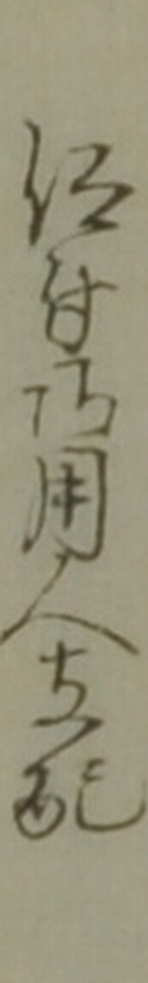仰付御用人支配

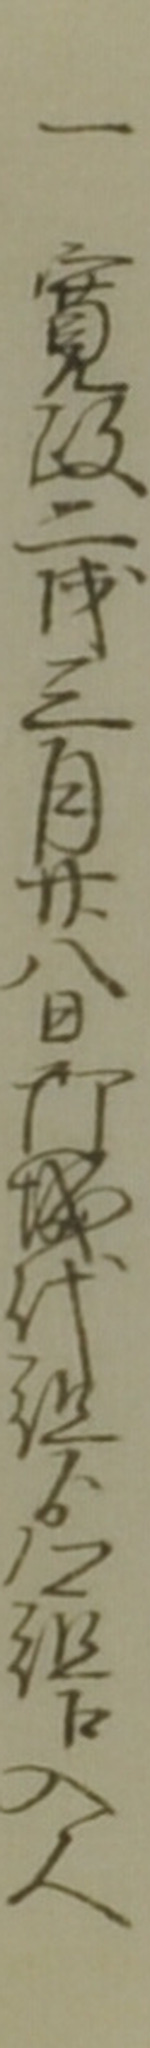一寛政二戌三月廿八日御城代組ゟ郷組江入人
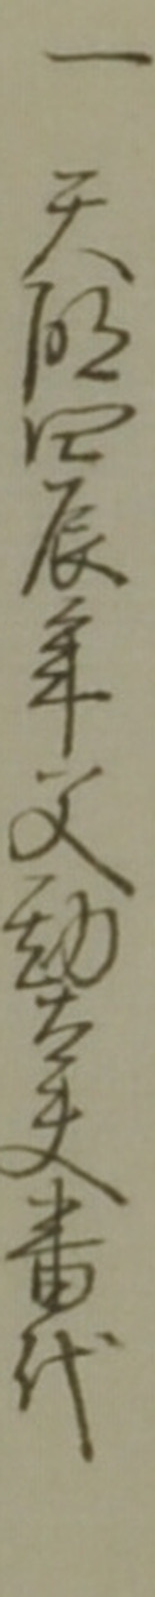一天明四辰年父勘太夫番代
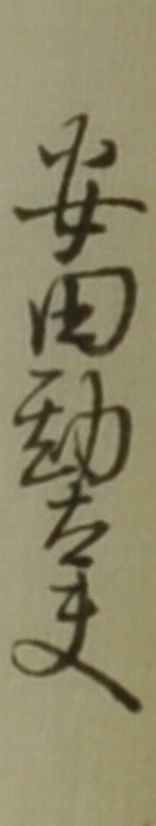安田勘太夫
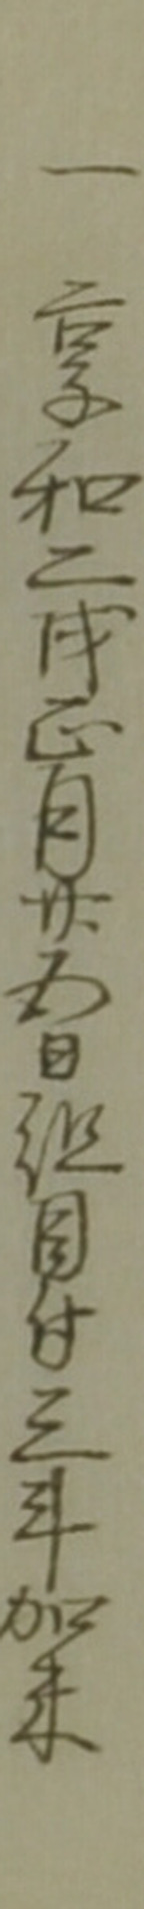一享和二戌正月廿五日組目付三斗加米
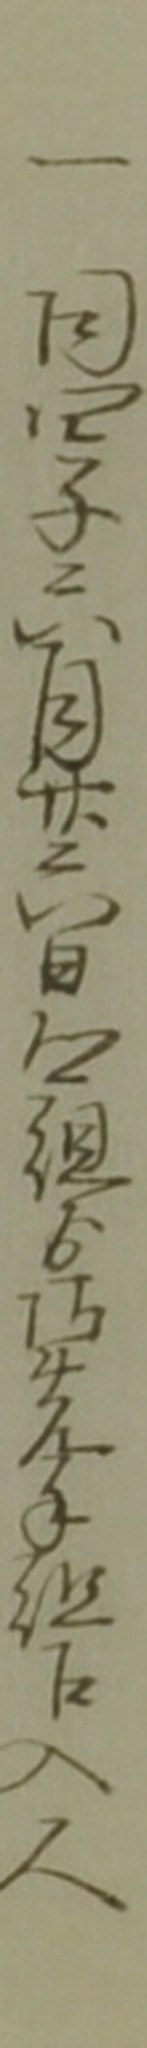一同四子六月廿六日郷組ゟ御先手組江入人
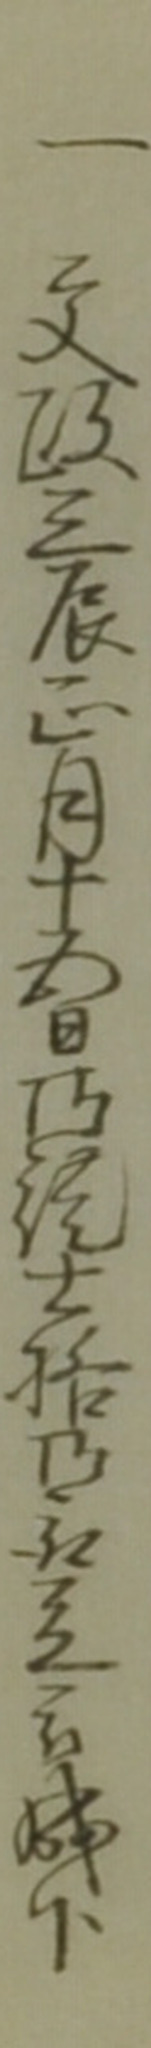一文政三辰正月十五日御徒士格御取立被成下
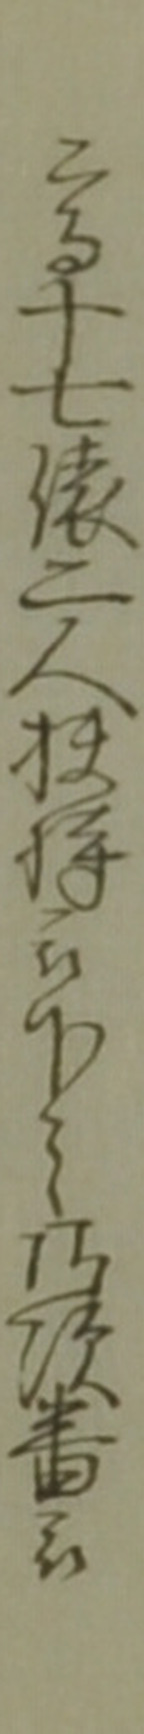高十七俵二人扶持被下之御次番被
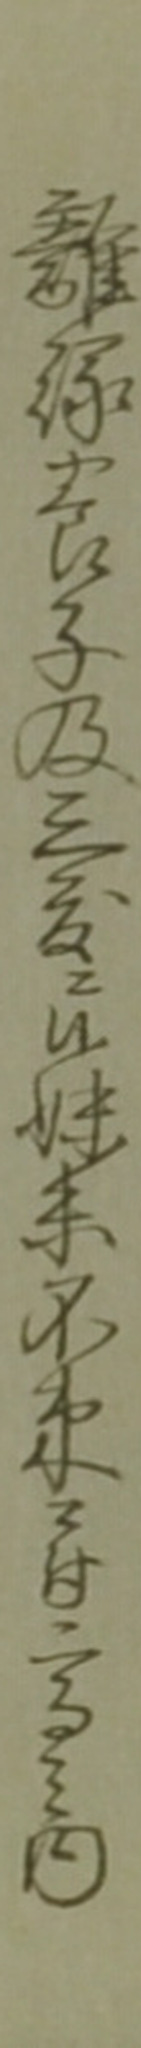離縁養子及三度ニ候妹未不束ニ付高之内
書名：無足諸士勤仕録（七）
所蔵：伊那市立高遠町図書館・合同会社AMANE
